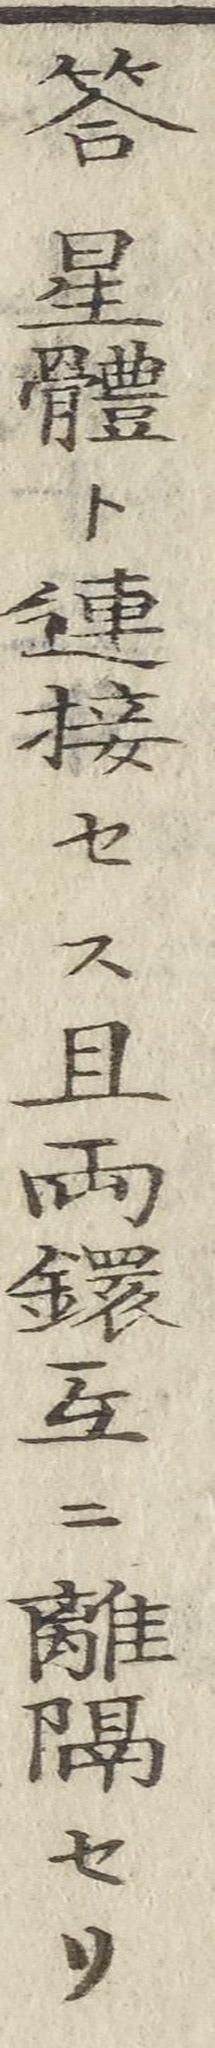答星体ト連接セス且両鐶互ニ離隔セリ
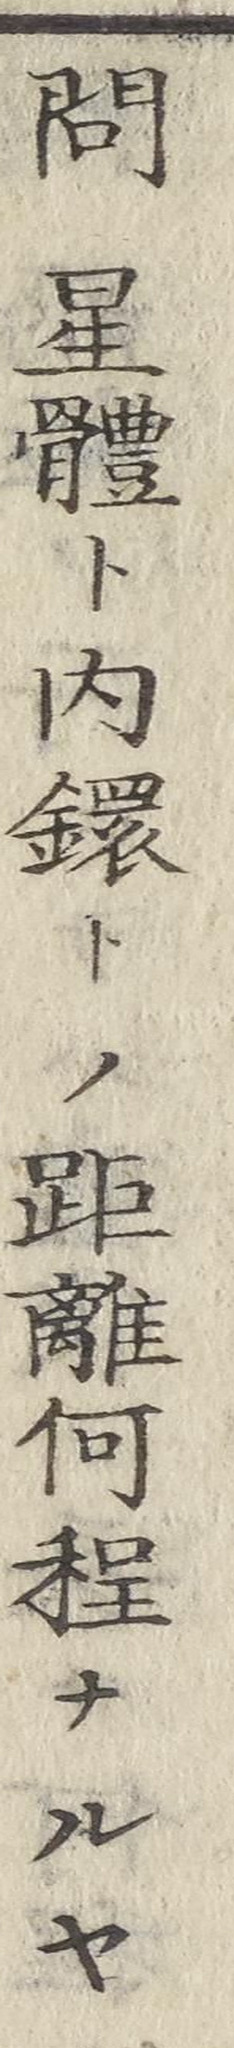問星体ト内鐶トノ距離何程ナルヤ
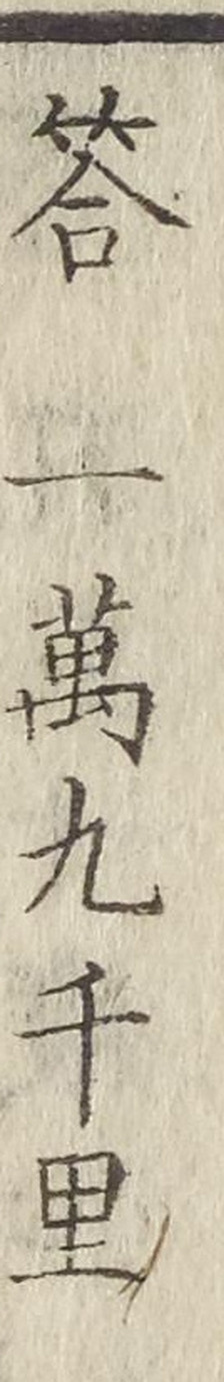答一万九千里
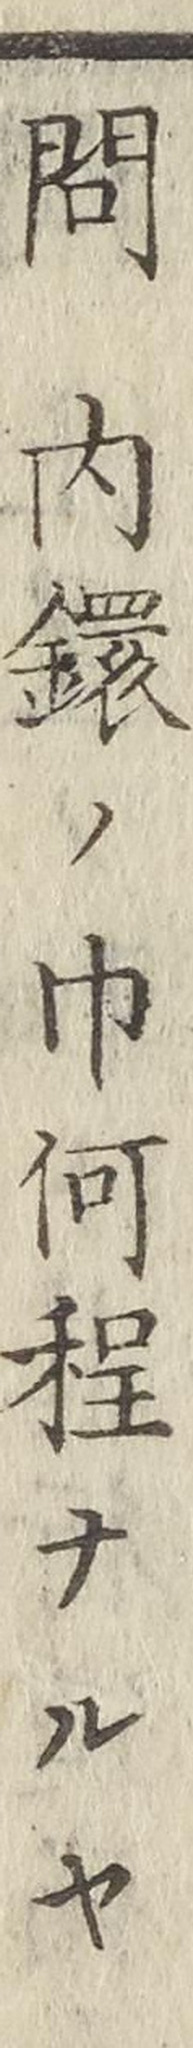問内鐶ノ巾何程ナルヤ
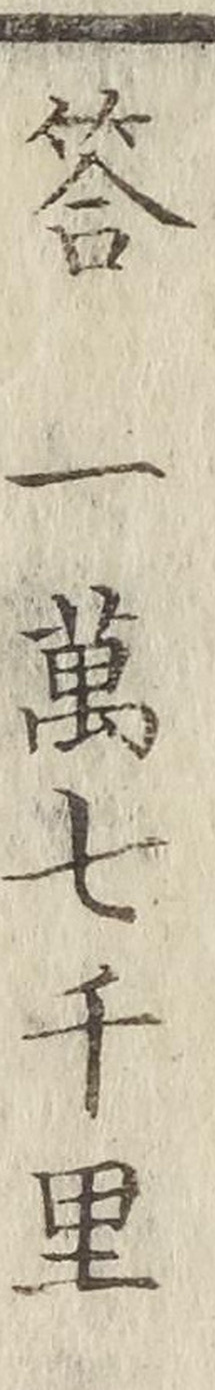答一万七千里
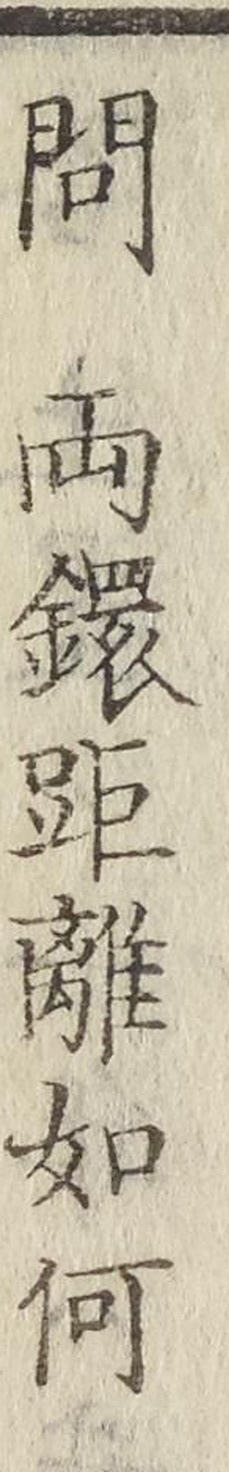問両鐶距離如何
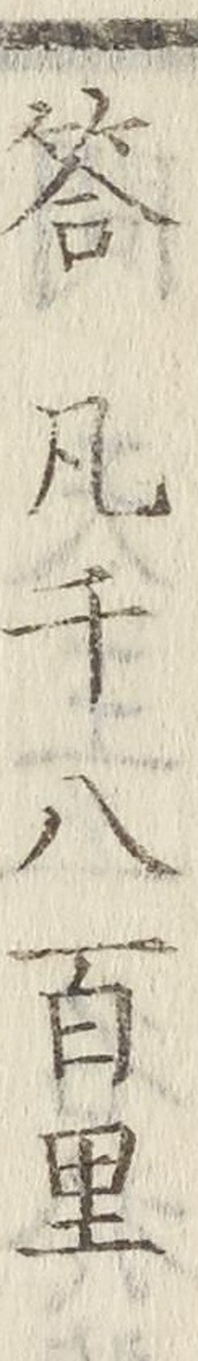答凡千八百里
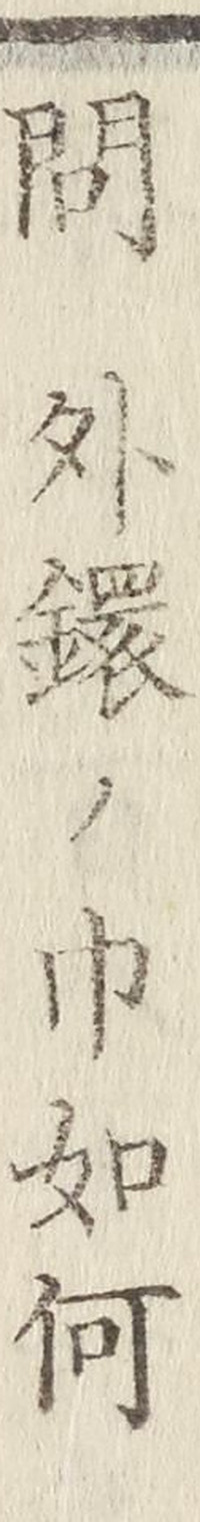問外鐶ノ巾如何
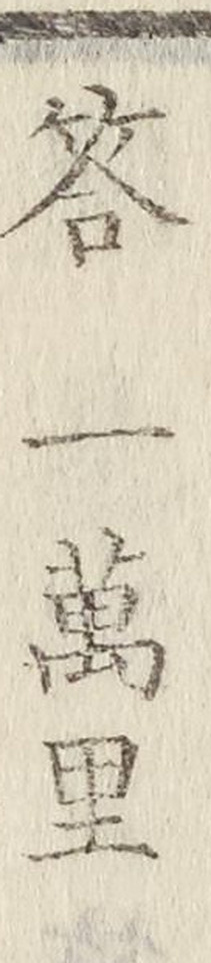答一万里
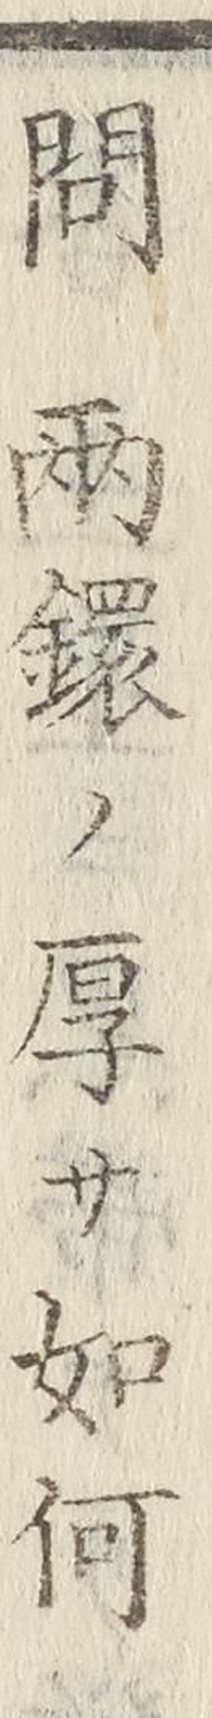問両鐶ノ厚サ如何
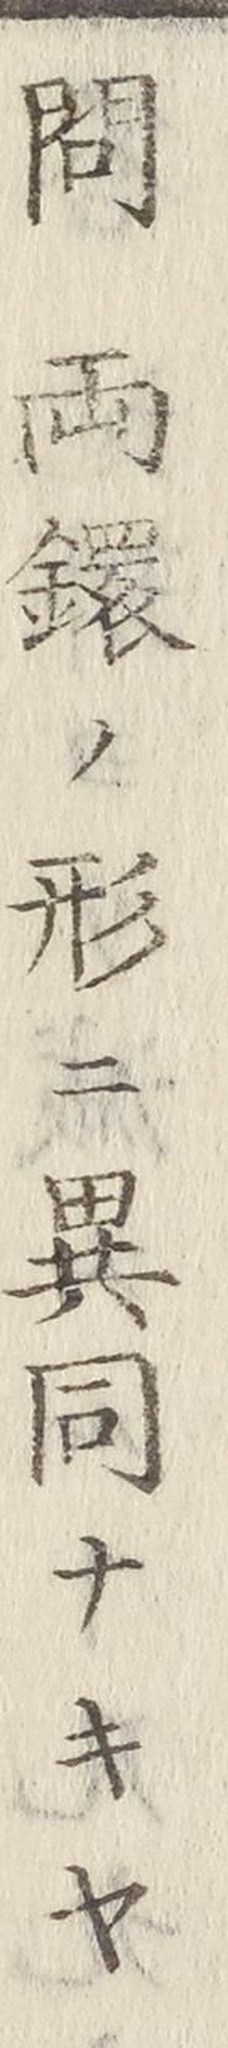問両鐶ノ形ニ異同ナキヤ
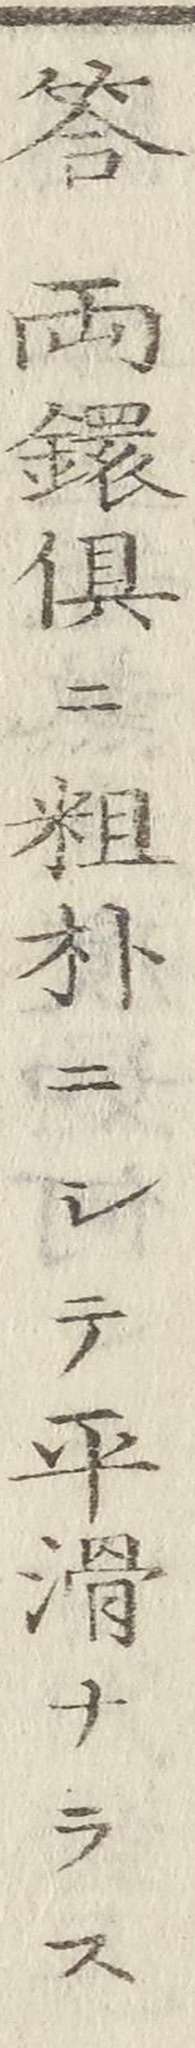答両鐶倶ニ粗朴ニシテ平滑ナラス
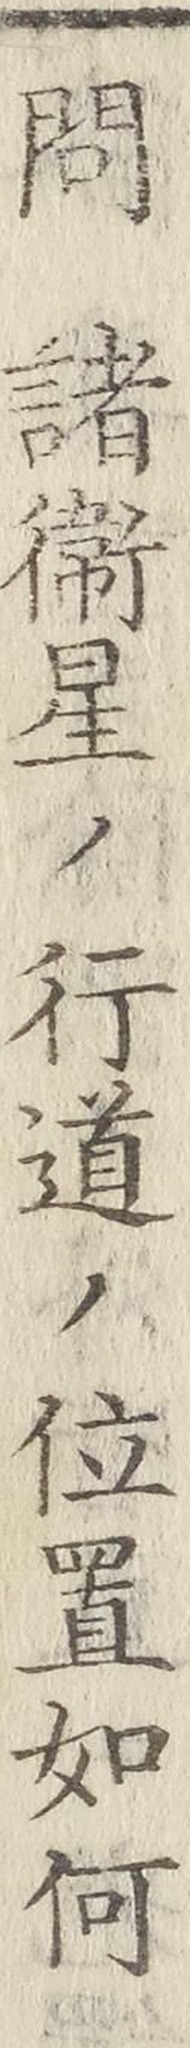問諸衛星ノ行道ノ位置如何

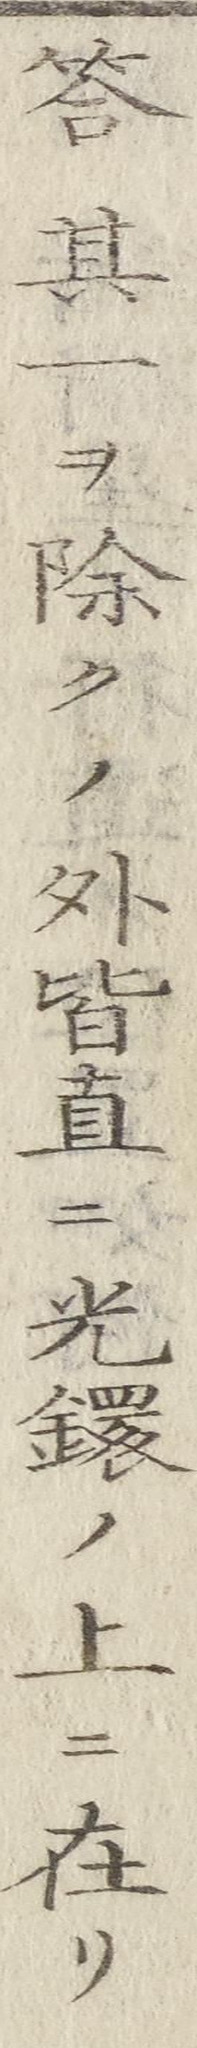答其一ヲ除クノ外皆直ニ光鐶ノ上ニ在リ
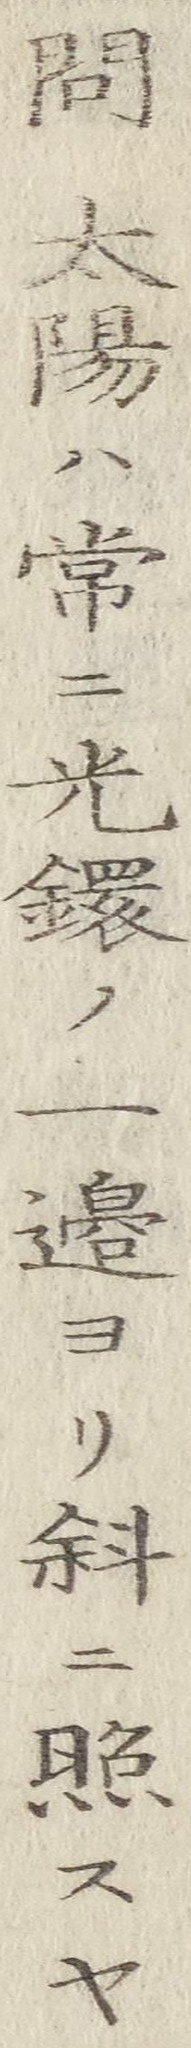問太陽ハ常ニ光鐶ノ一辺ヨリ斜ニ照スヤ
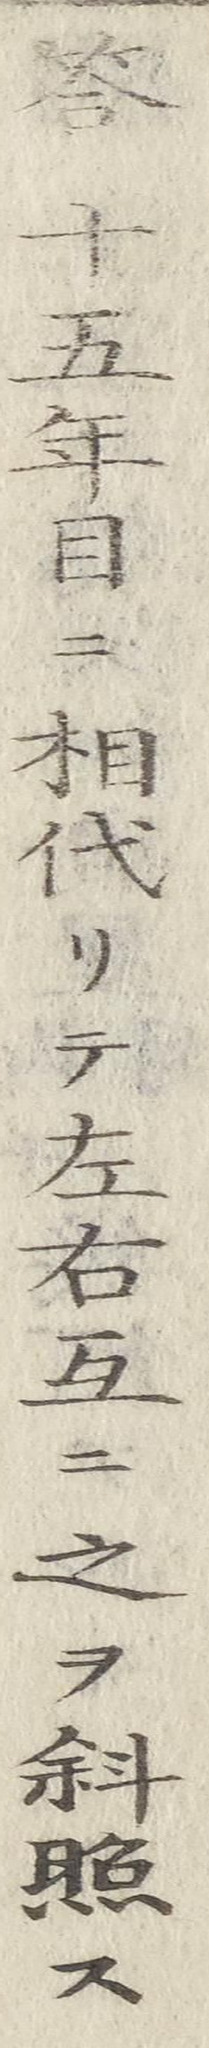答十五年目ニ相代リテ左右ニ之ヲ斜照ス
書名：星学圖説　下
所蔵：東京大学地震研究所図書室 Earthquake Research Institute Library, The University of Tokyo, JAPAN
